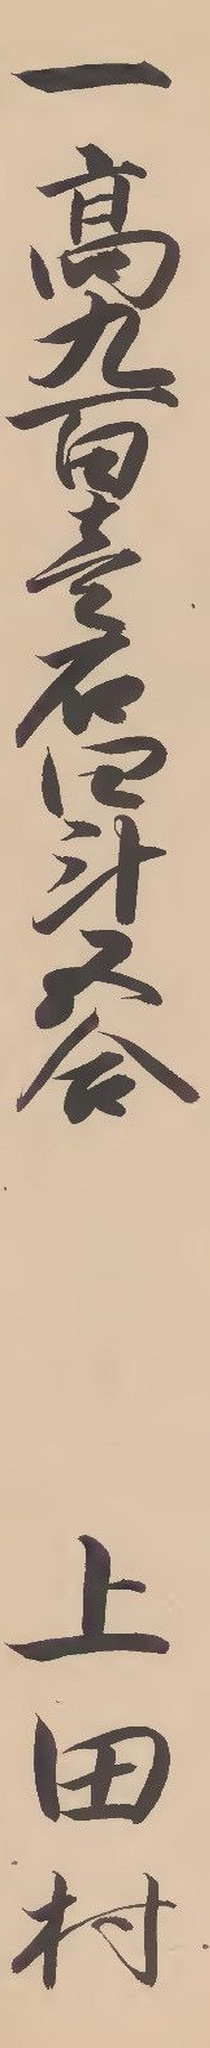一高九百壱石四斗五合上田村

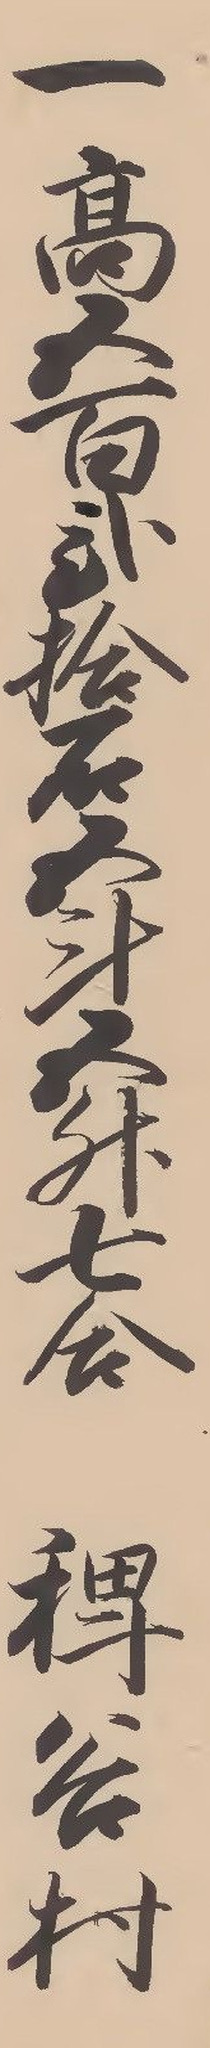一高五百弐拾石五斗五升七合稗谷村
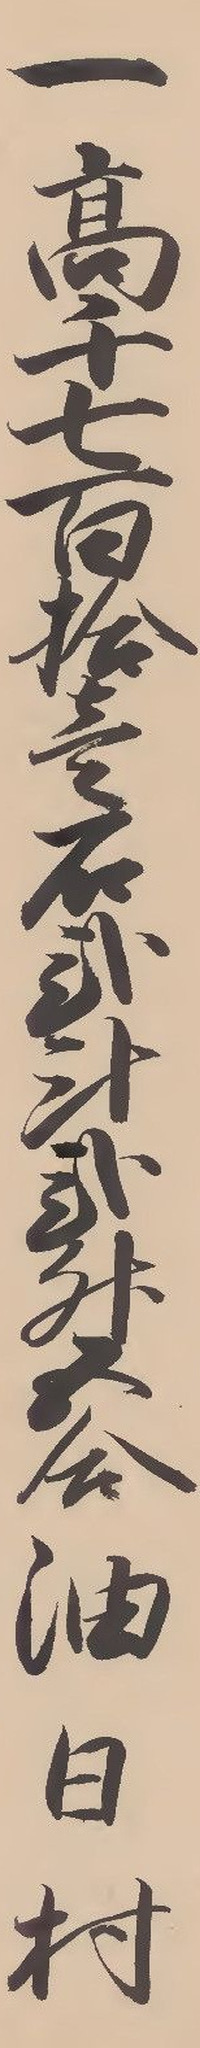一高千七百拾壱石弐斗弐升五合油日村
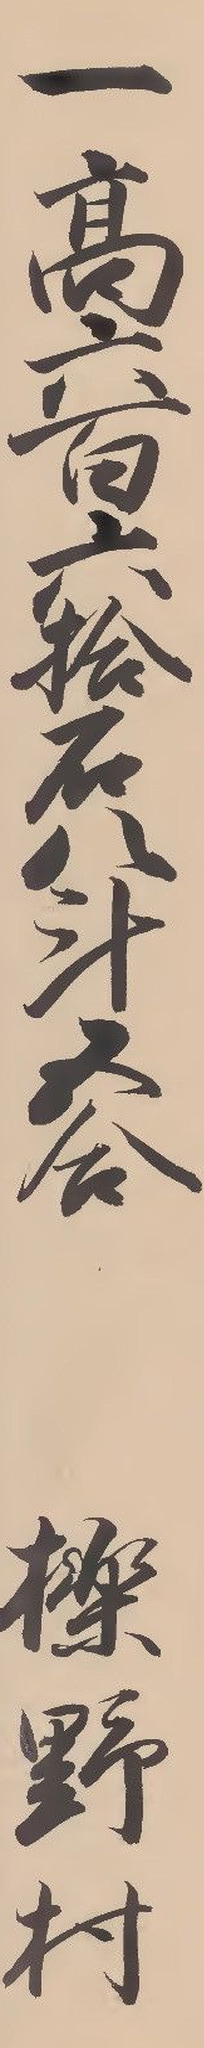一高六百六拾石八斗五合礫野村
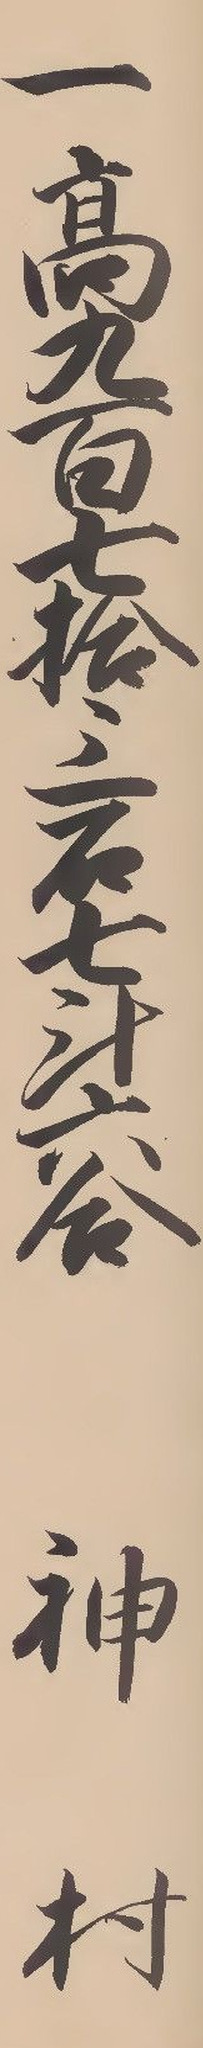一高九百七拾三石七斗六合神村
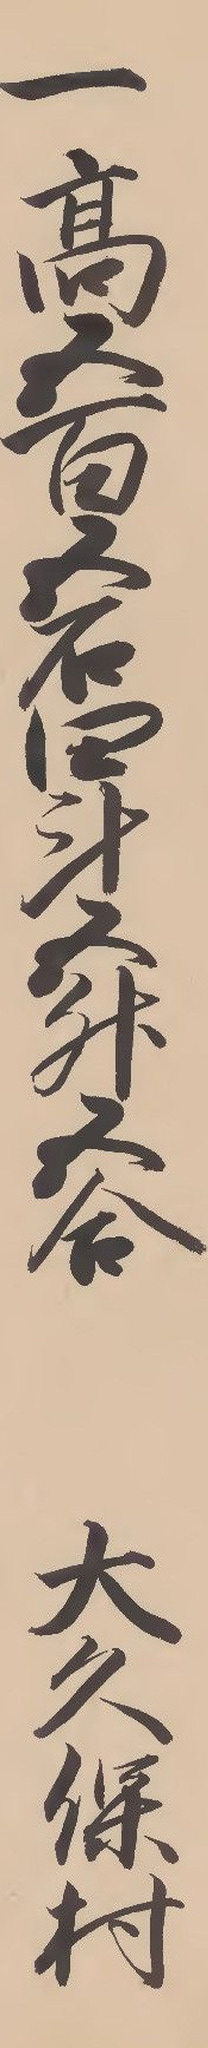一高五百五石四斗五升五合大久保村
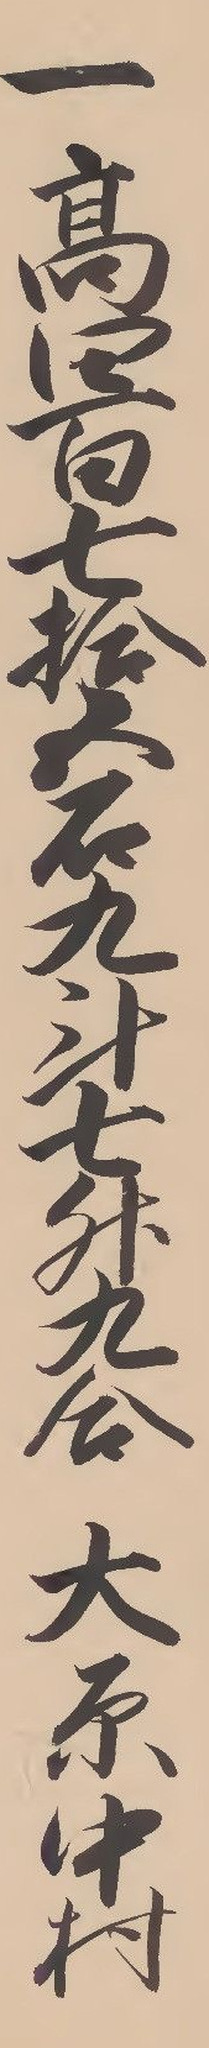一高四百七拾五石九斗七升九合大原中村
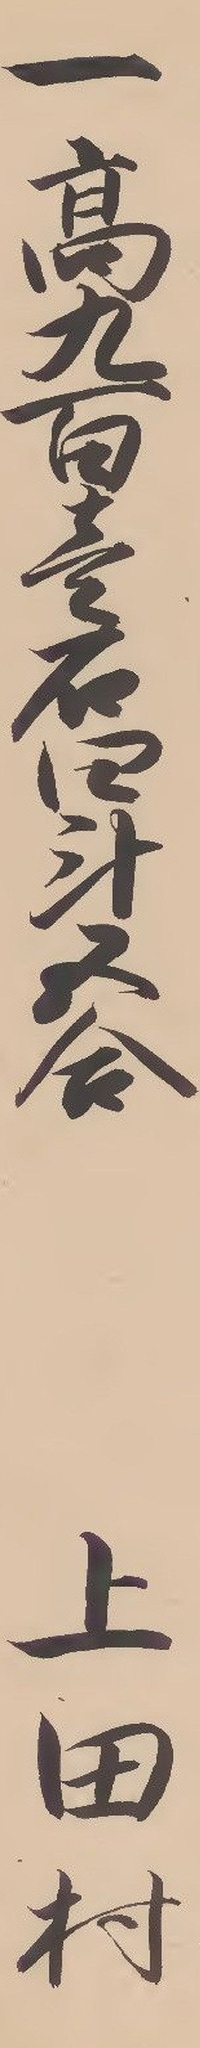一高九百壱石四斗五合上田村

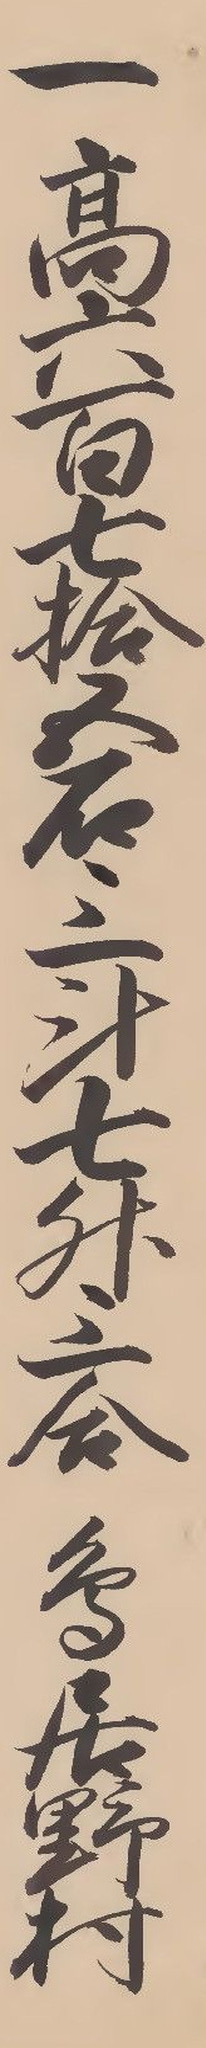一高六百七拾五石三斗七升三合鳥居野村
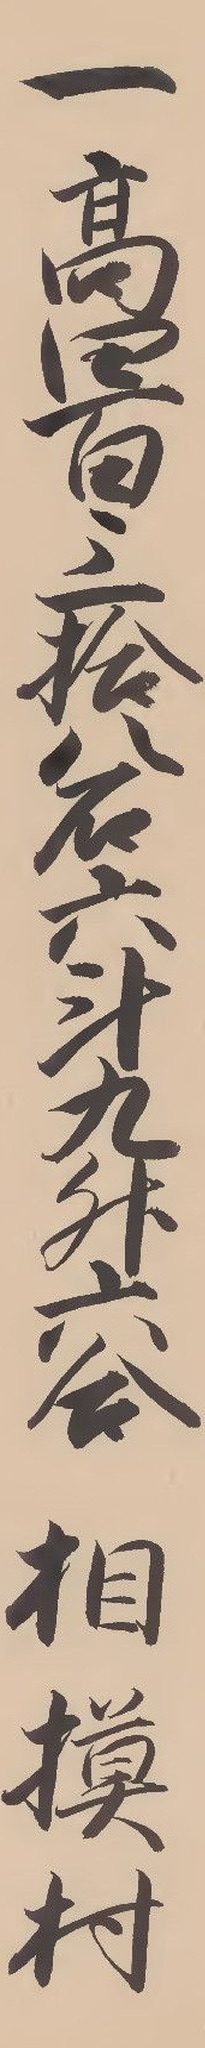一高四百三拾八石六斗九升六合相模村
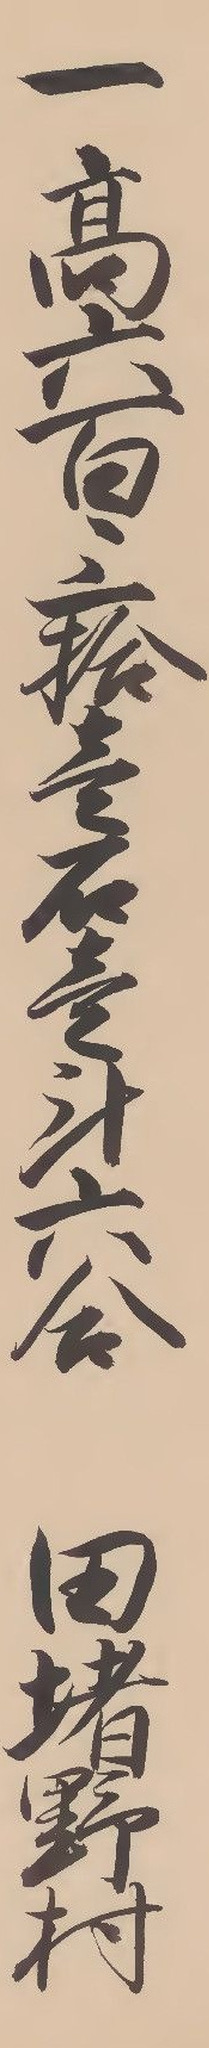一高六百三拾壱石壱斗六合田堵野村
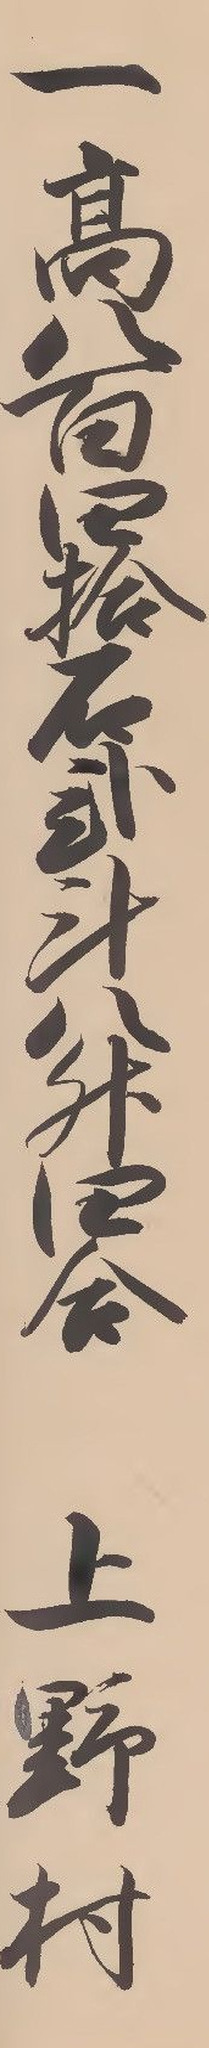一高八百四拾石弐斗八升四合上野村
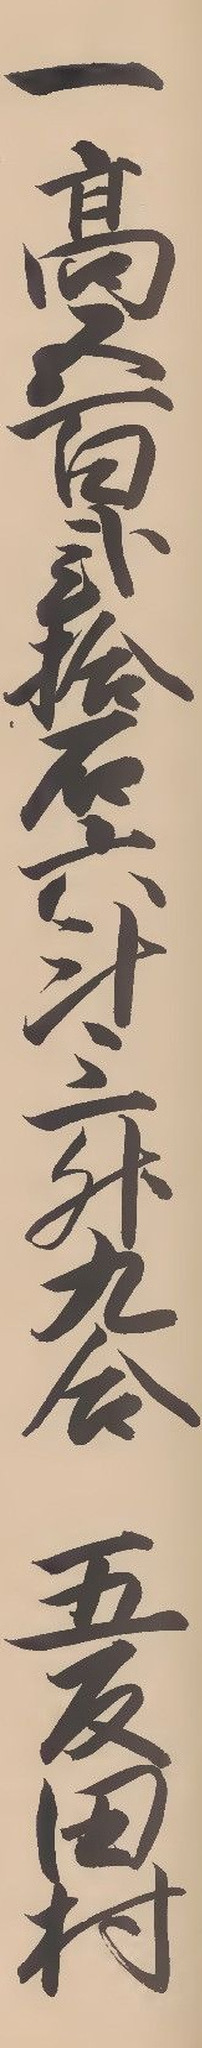一高五百弐拾石六斗三升九合五反田村
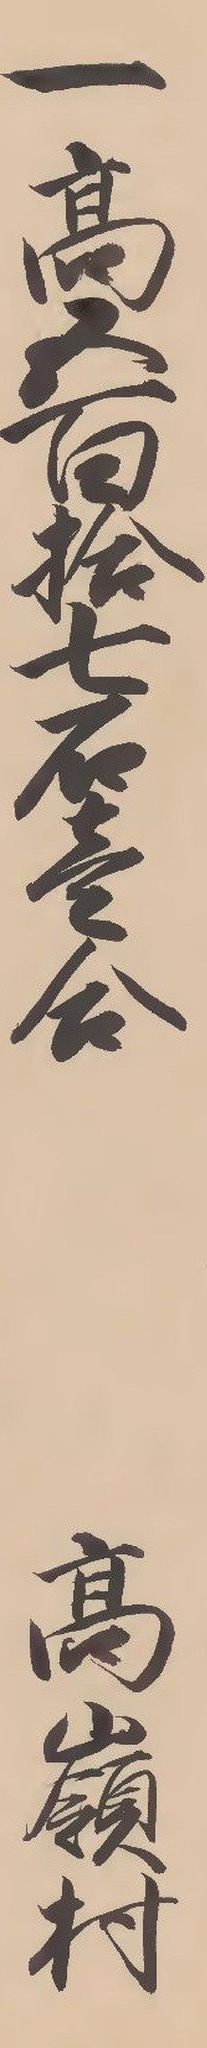一高五百拾七石壱合高嶺村
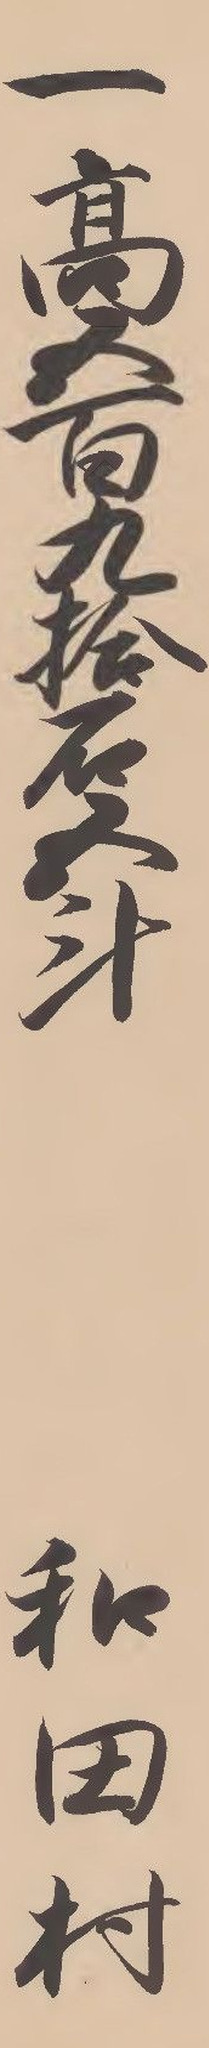一高五百九拾石五斗和田村
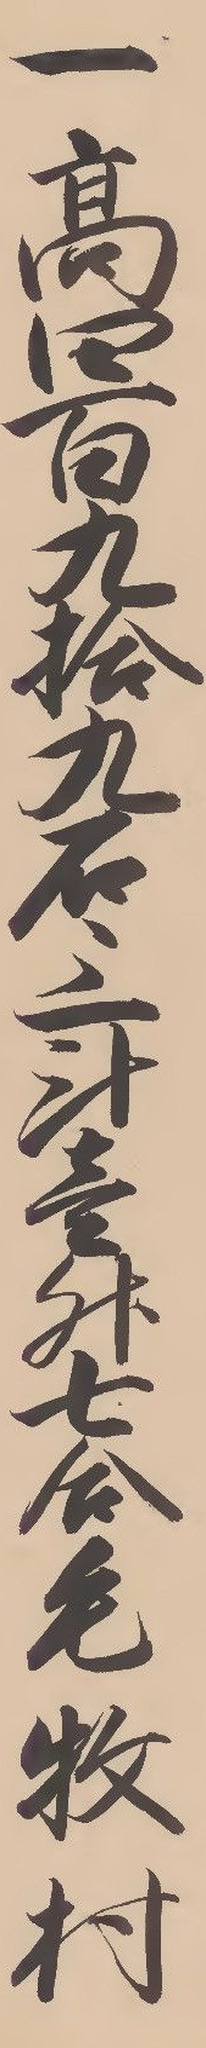一高四百九拾九石三斗壱升七合毛牧村
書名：近江国郷帳
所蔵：国立公文書館 National Archives of Japan
